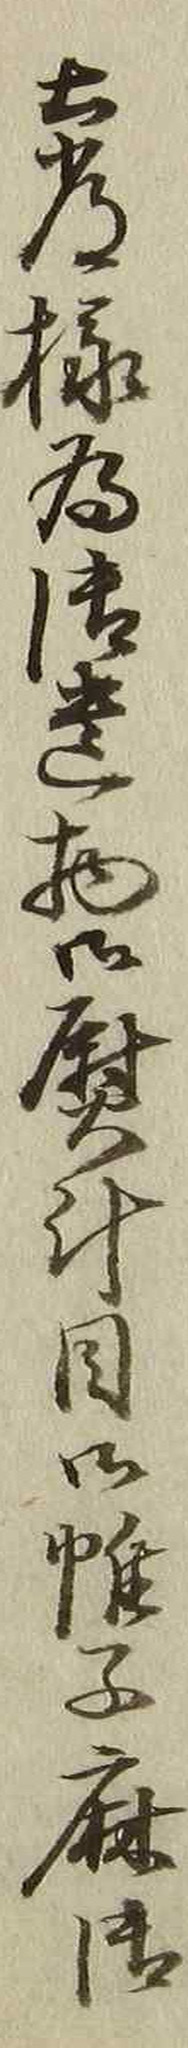土常様為御遣物御熨斗目御帷子麻御
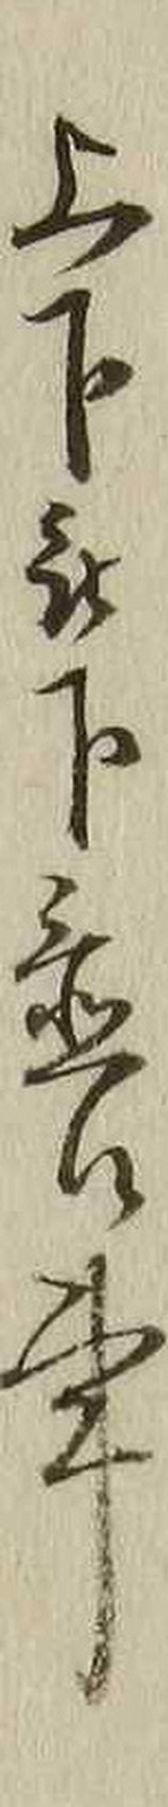上下被下置候事
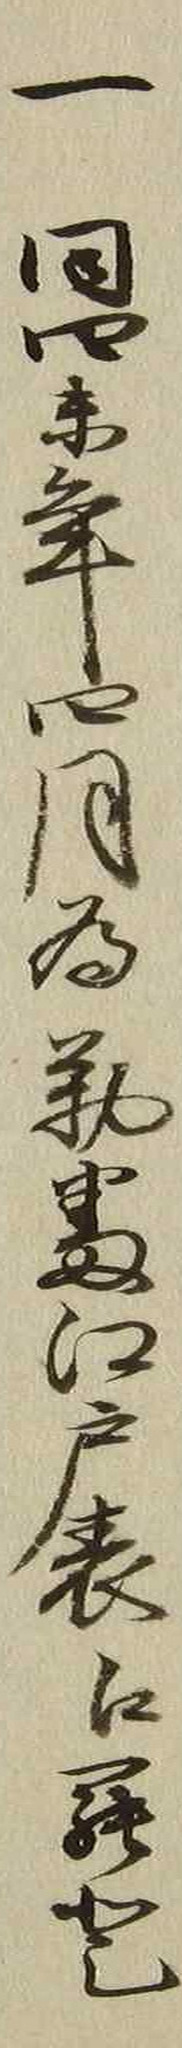一同四未年四月為勤番江戸表江罷登
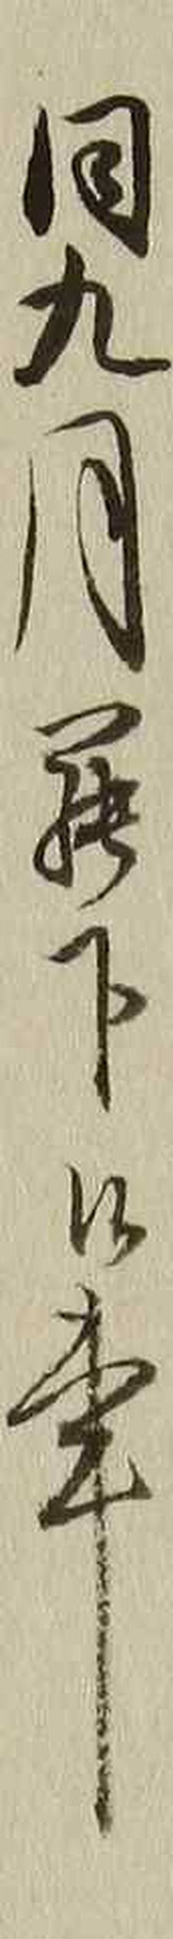同九月罷下候事
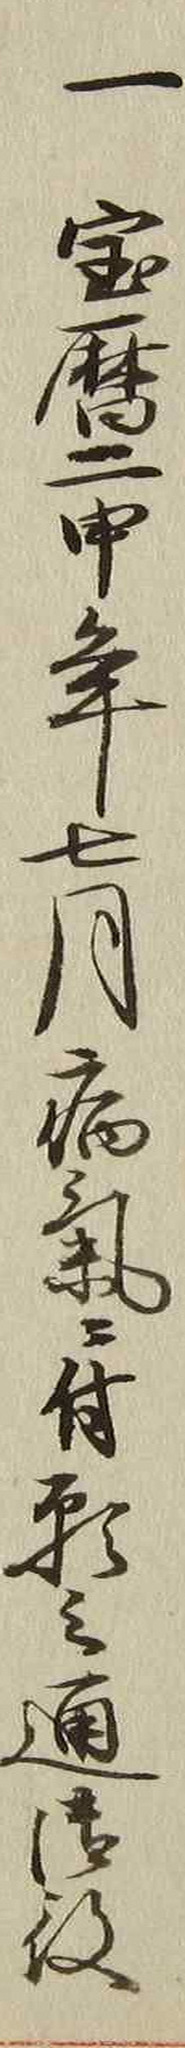一宝暦ニ申年七月病気ニ付願之通御役
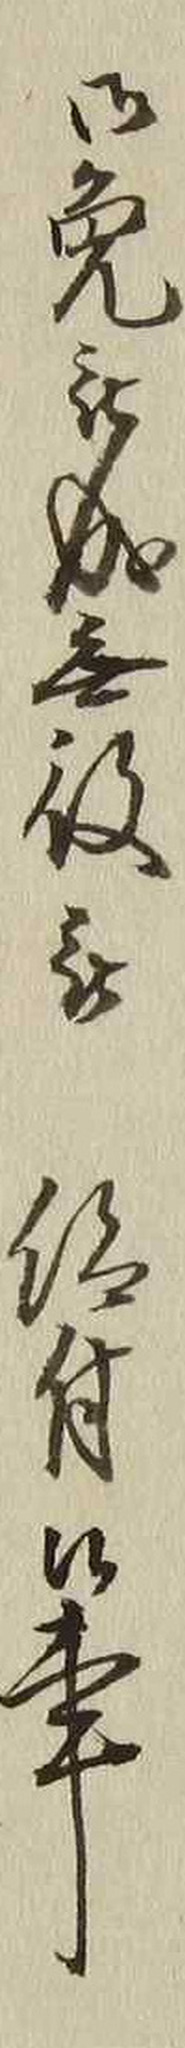御免被成無役被仰付候事
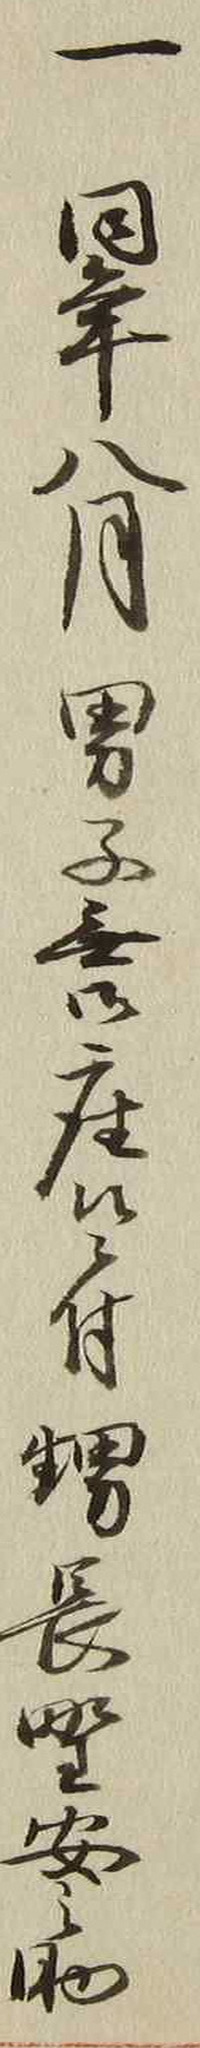一同年八月男子無御座候ニ付甥長野安之助
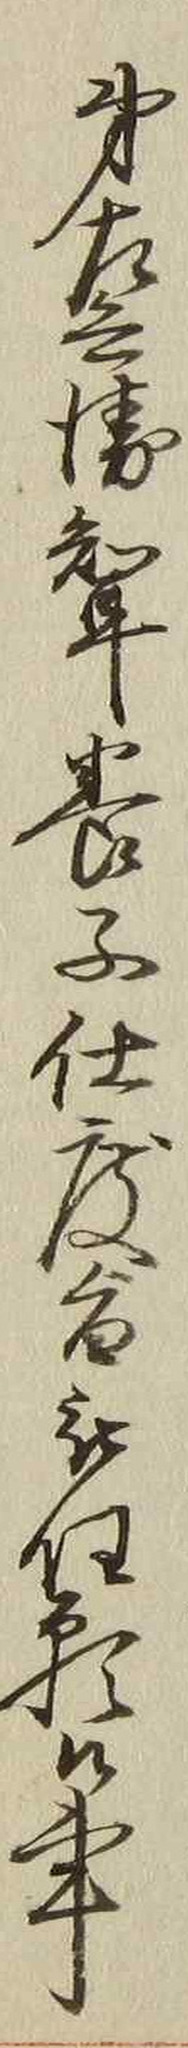弟左兵衛聟養子仕度旨被伺願候事
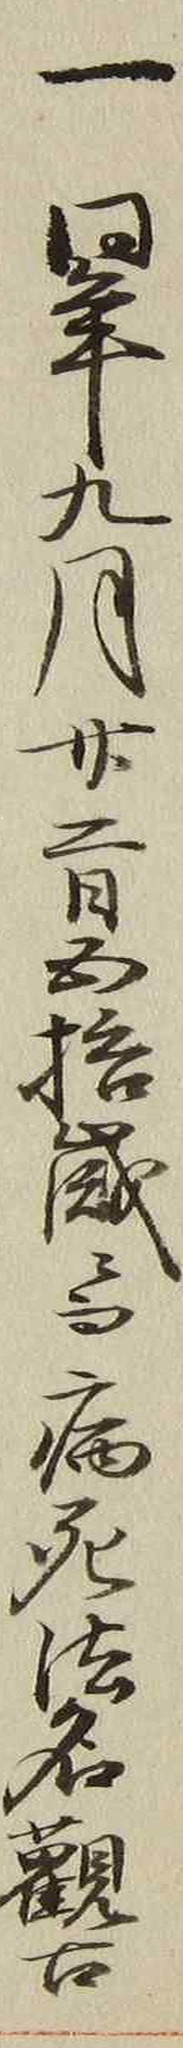一同年九月廿二日五拾歳ニ而病死法名觀古
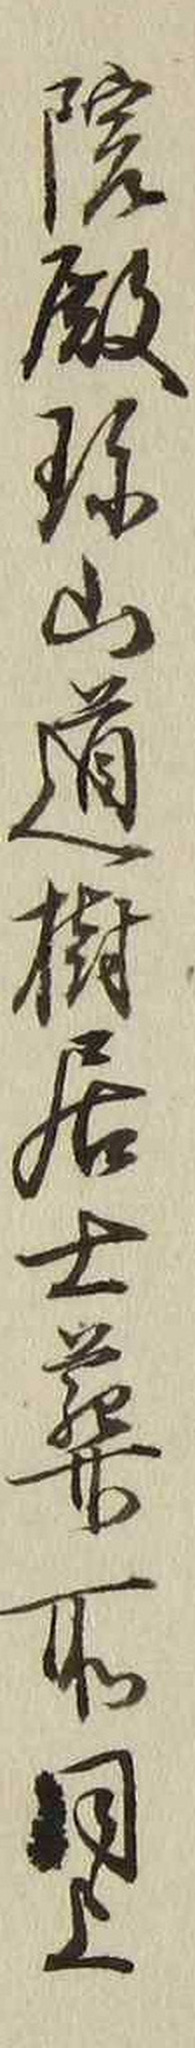院殿珍山道樹居士葬所同上
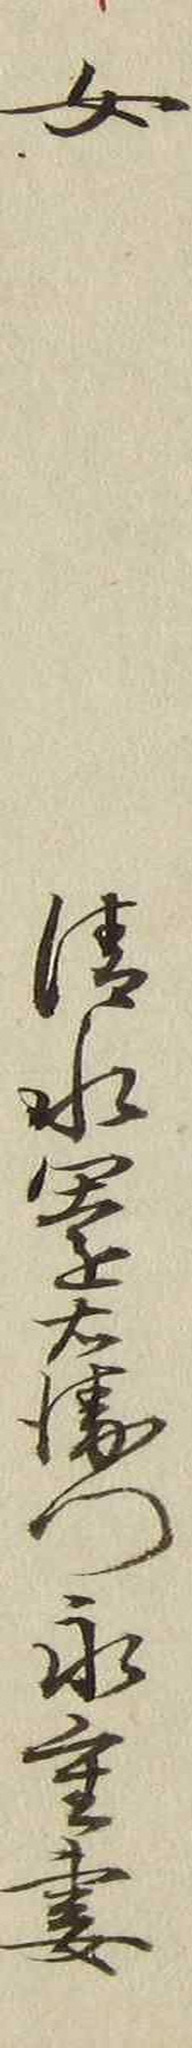女清水園右衛門永重妻
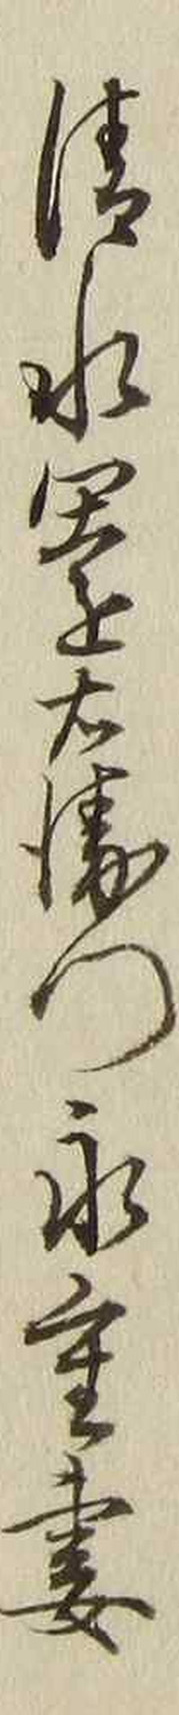女清水園右衛門永重妻
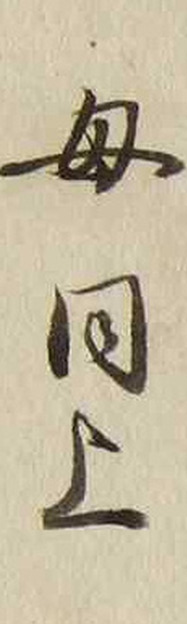母同上

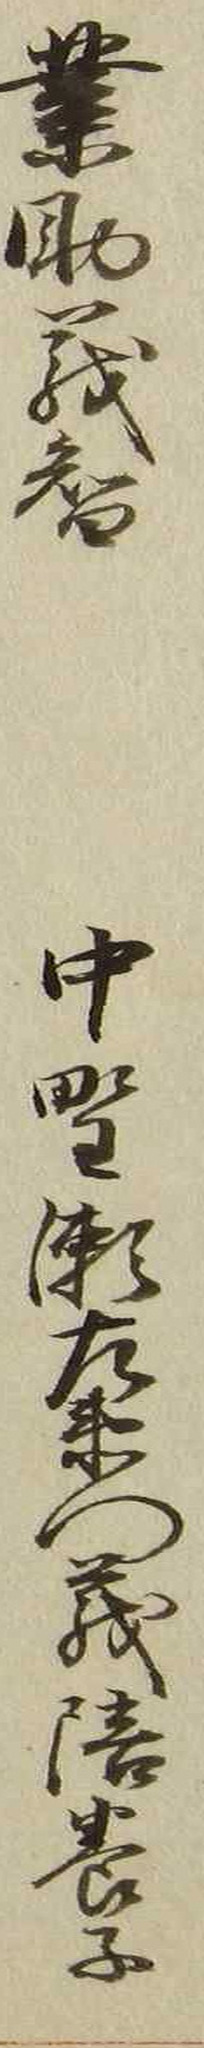業助義智中野瀬左衛門義陪養子
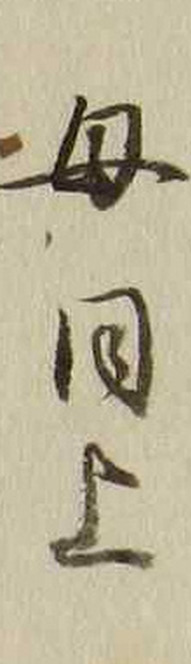母同上
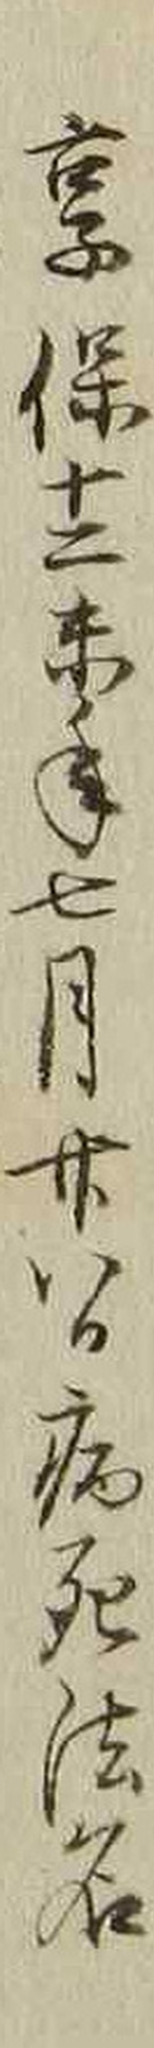金弥享保十二未年七月廿八日病死法名
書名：諸士系譜　巻之114　か之部22
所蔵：会津若松市立会津図書館
